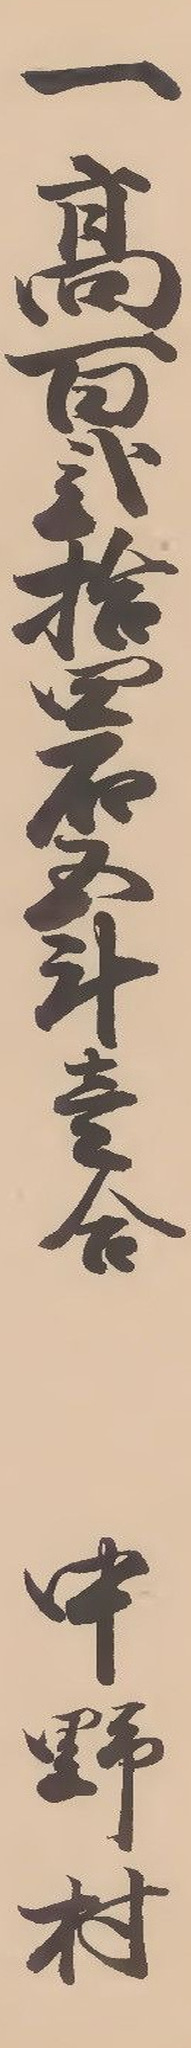一高百弐拾四石五斗壱合中野村
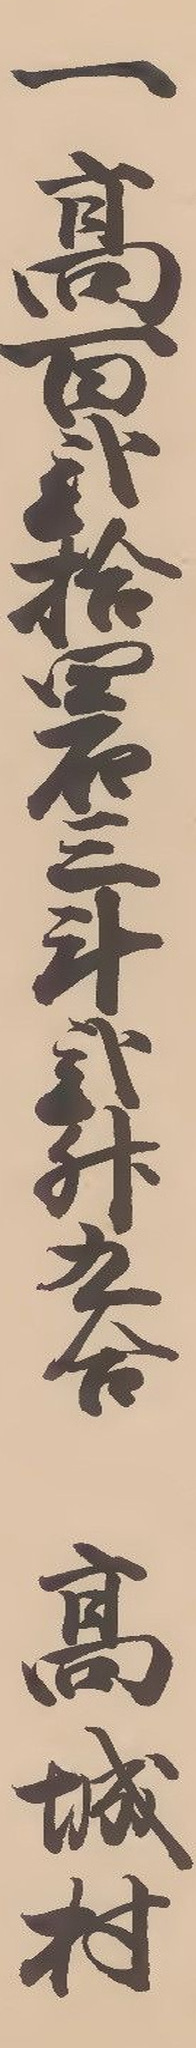一高百弐拾四石三斗弐升九合高城村
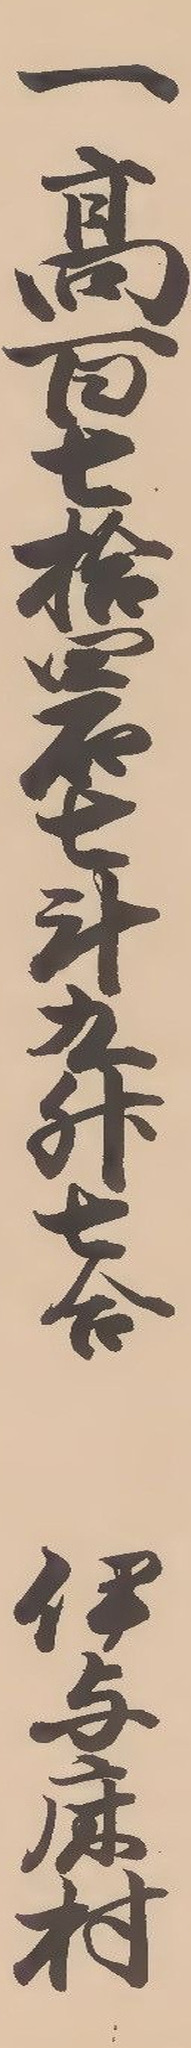一高百七拾四石七斗九升七合伊与床村
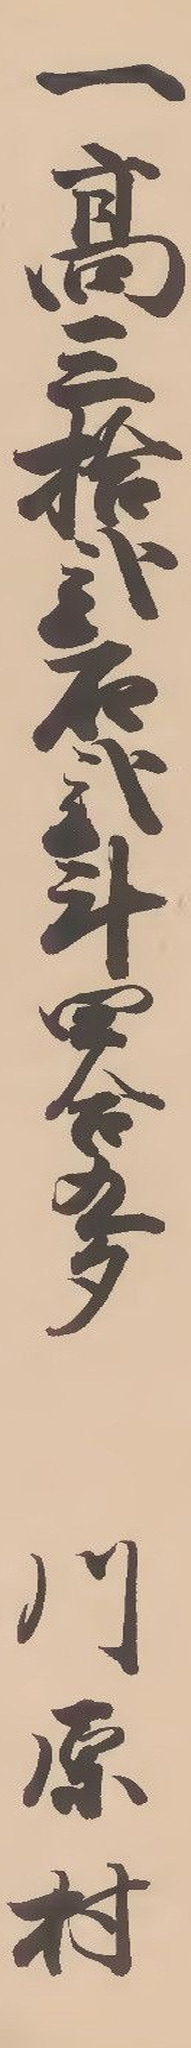一高三拾弐石弐斗四合九勺川原村
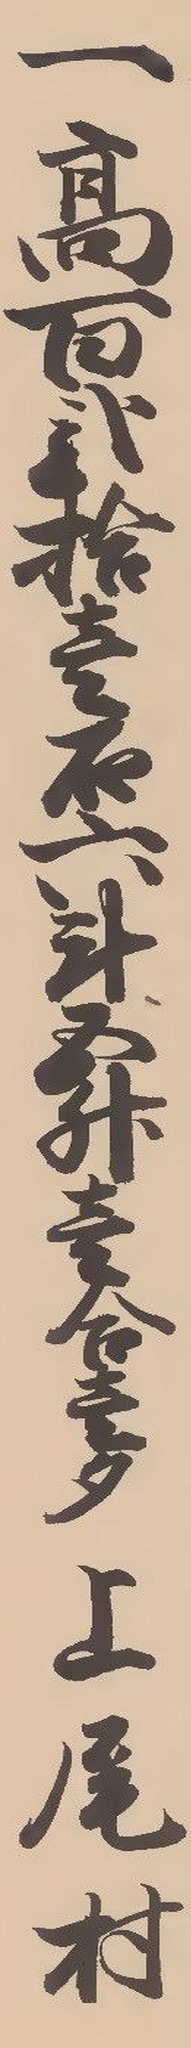一高百弐拾壱石六斗五升壱合壱勺上尾村
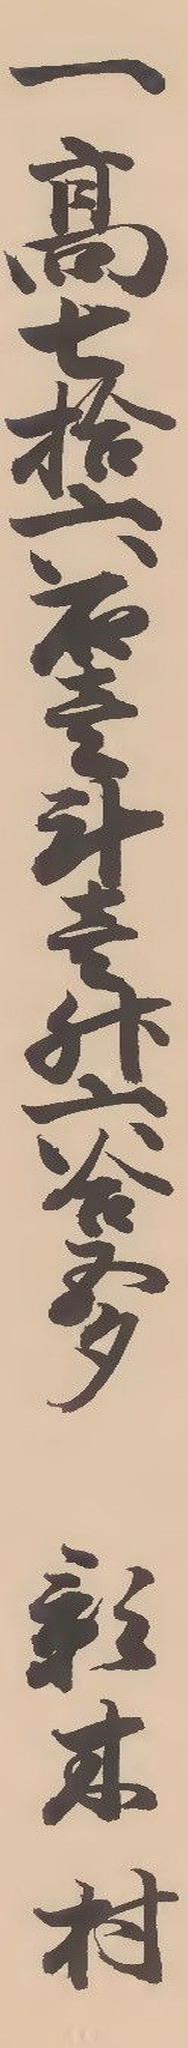一高七拾六石壱斗壱升六合五勺影木村
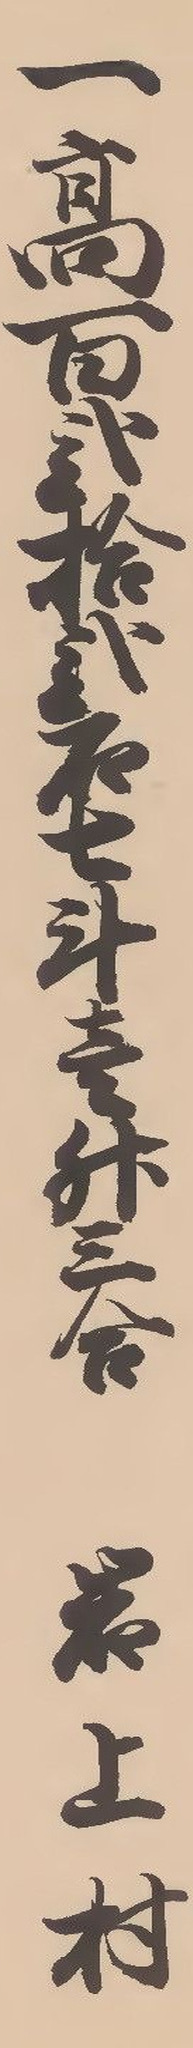一高百弐拾弐石七斗壱升三合岩上村
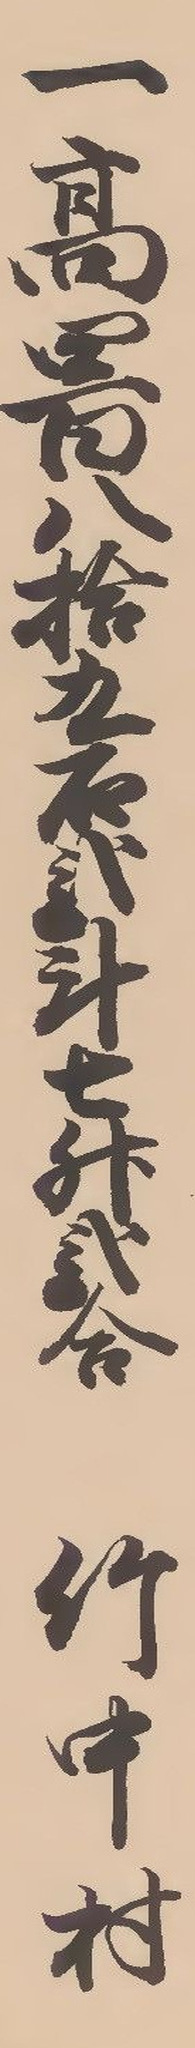一高四百八拾九石弐斗七升弐合竹中村

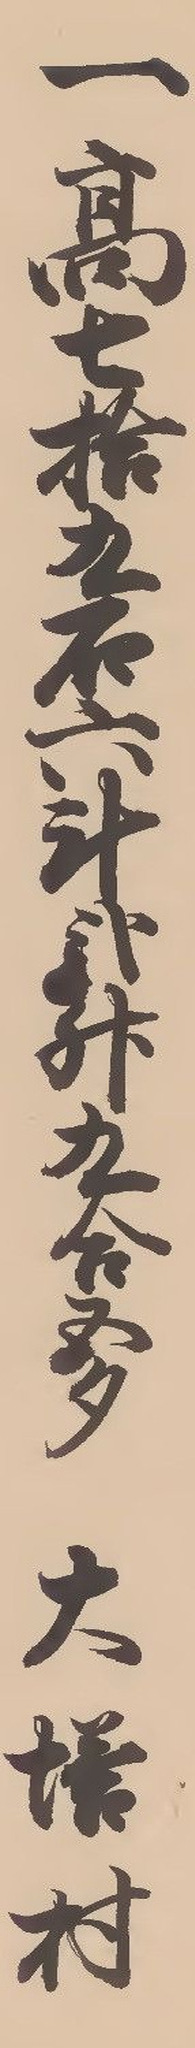一高七拾九石六斗弐升九合五勺大塔村
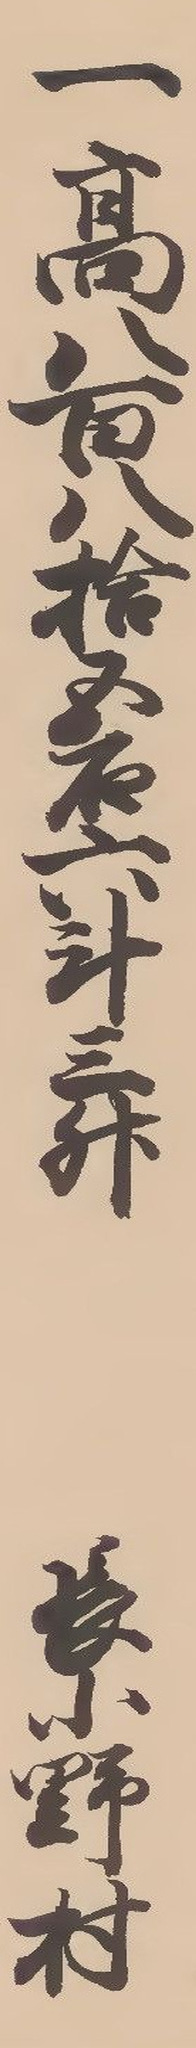一高八百八拾五石六斗三升長小野村
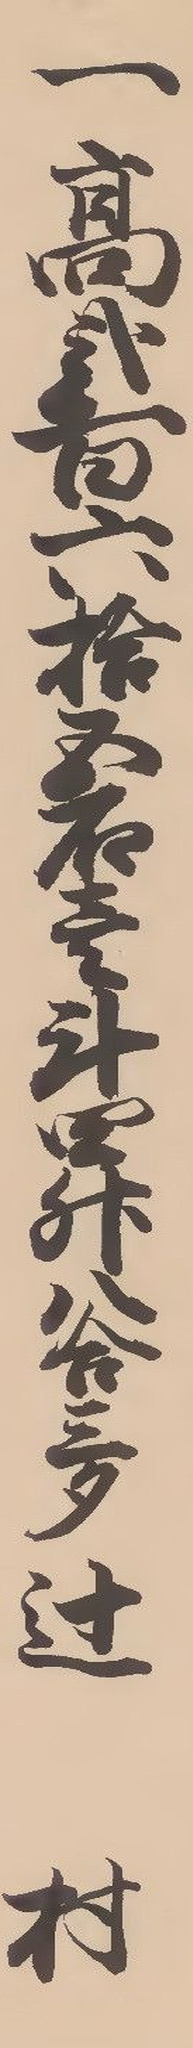一高弐百六拾五石壱斗四升八合三勺辻村
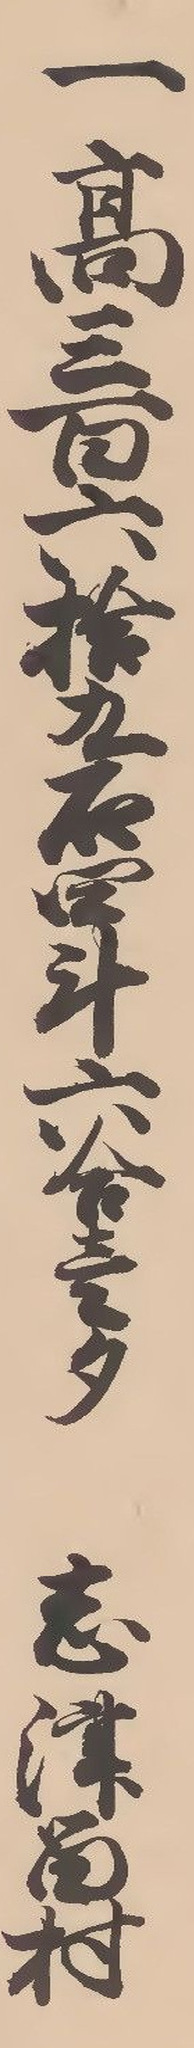一高三百六拾九石四斗六合壱勺志津留村
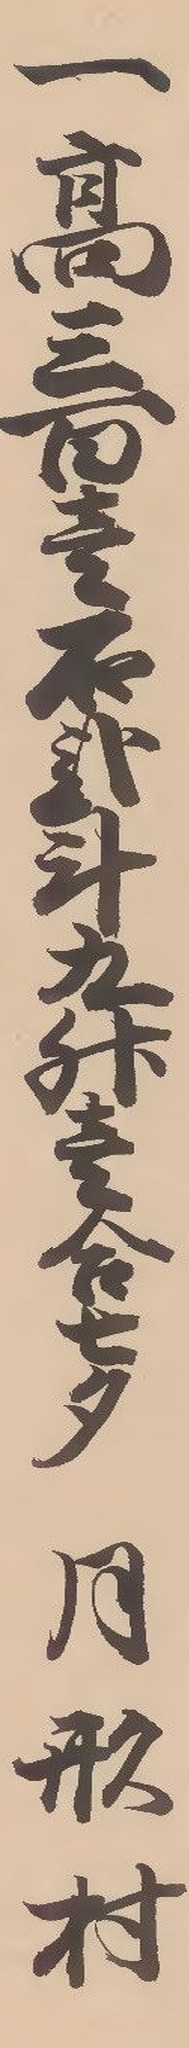一高三百壱石弐斗九升壱合七勺月形村
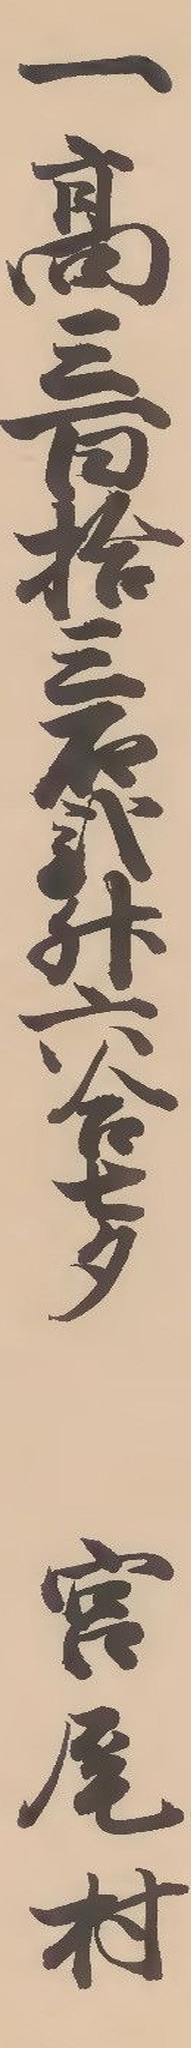一高三百拾三石弐升六合七勺宮尾村
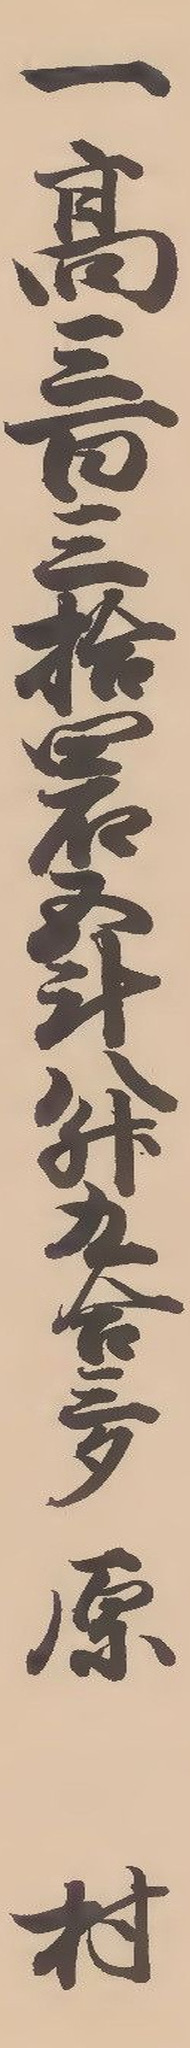一高三百三拾四石五斗八升九合三勺原村
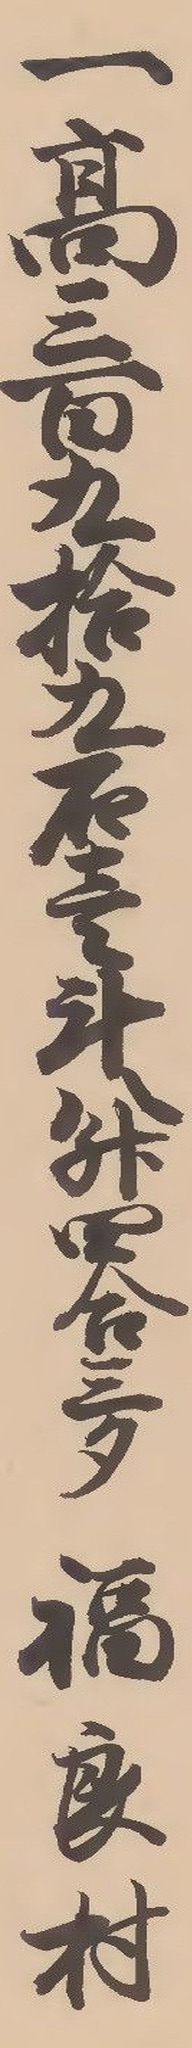一高三百九拾九石壱斗八升四合三勺福良村
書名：豊後国郷帳
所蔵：国立公文書館 National Archives of Japan
